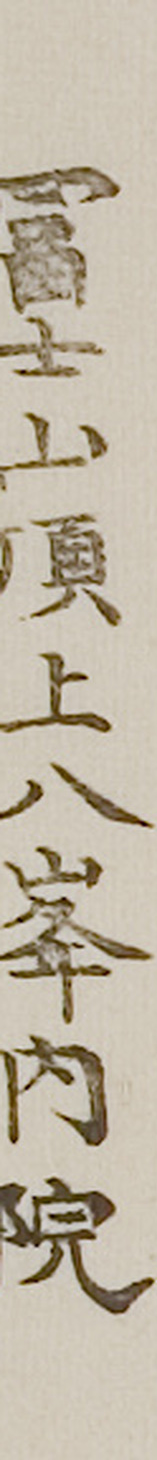冨士山頂上八峯内院
